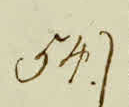54.
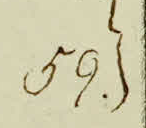59.
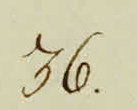36.
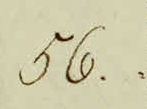56.
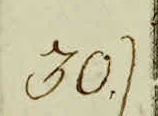30.
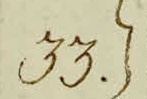33.
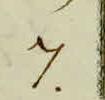7.
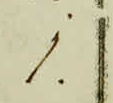1.
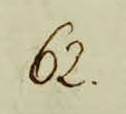62.
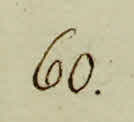60.
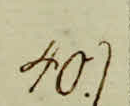40.
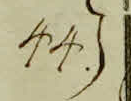44.
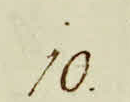10.
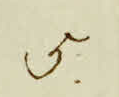5.
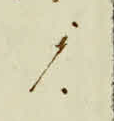1.
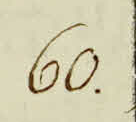60.
